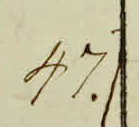47.
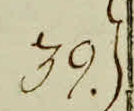39.
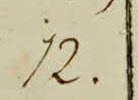12.
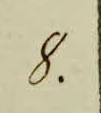8.
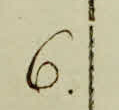6.
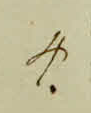4.
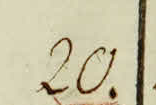20.
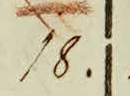18.
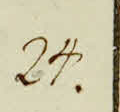24.
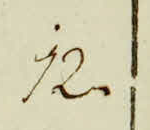12.
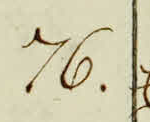76.
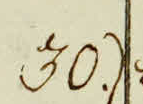30.
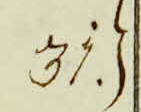31.
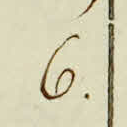6.
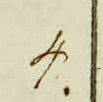4.
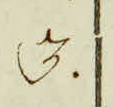3.
